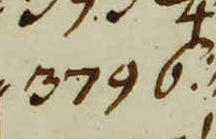3796
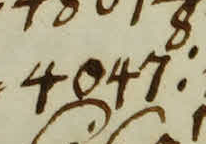4047
